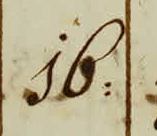16:
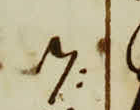7:
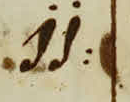11:
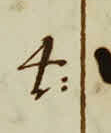4:
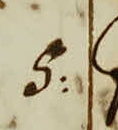5:
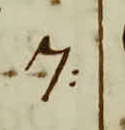7:
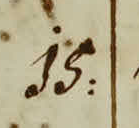15:
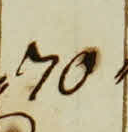70
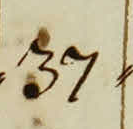37
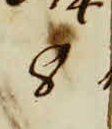8
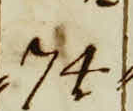74
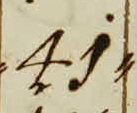41
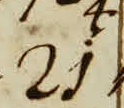21
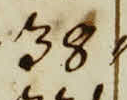38
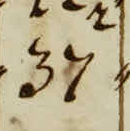37
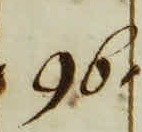96
